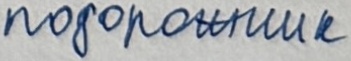подорожник
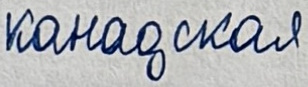канадская
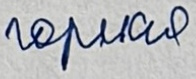горная
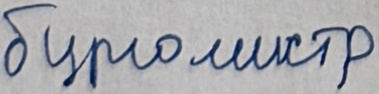бургомистр
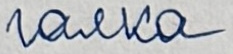галка
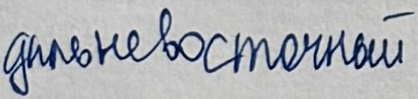дальневосточный
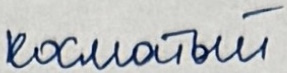косматый
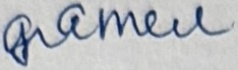дятел
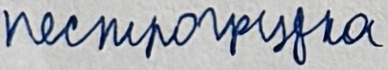пестрогрудка
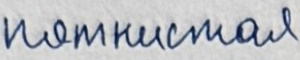пятнистая
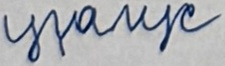урагус
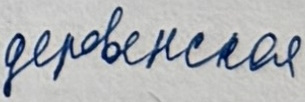деровенская
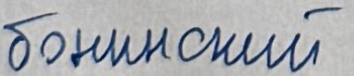бонинский
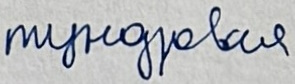тундровая
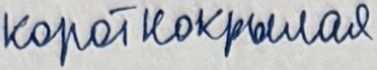короткокрылая
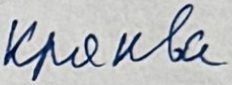кряква
